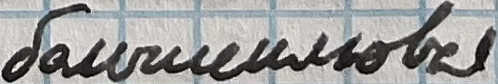большеклювая
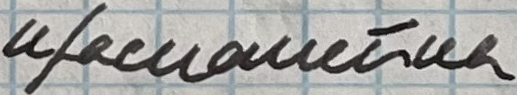красношейка
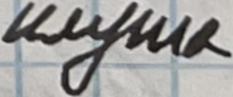клуша
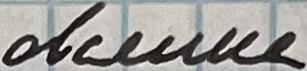овсянка
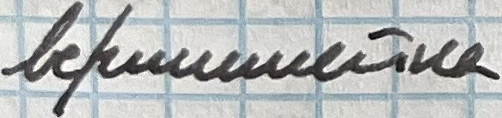вертишейка
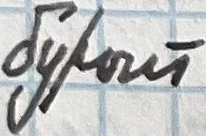бурый
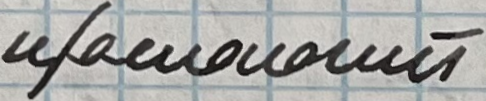красноногий
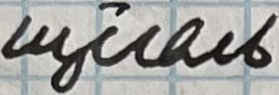щёголь
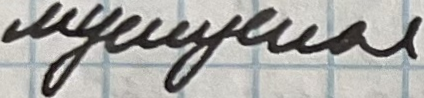мускусная
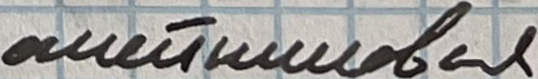ошейниковая
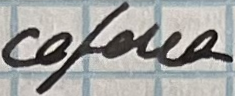сорока
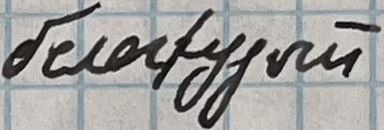белогрудый
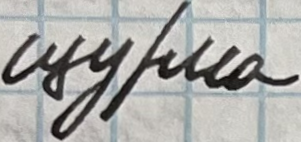щурка
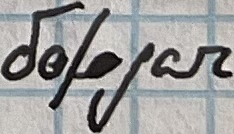бородач
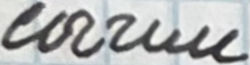сычик
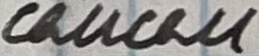сапсан
